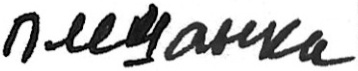плешанка
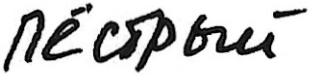пёстрый
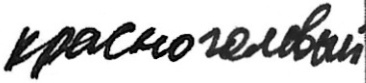красноголовый
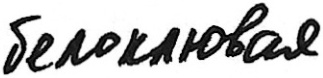белоклювая
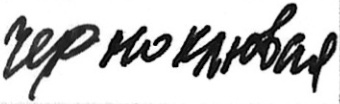черноклювая
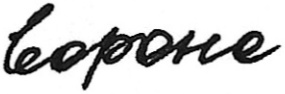ворона
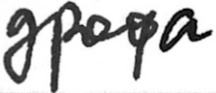дрофа
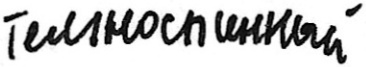темноспинный
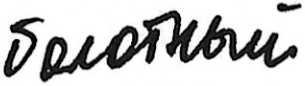болотный
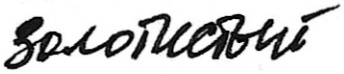золотистый
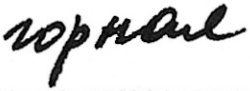горная
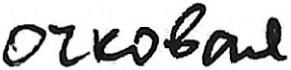очковая
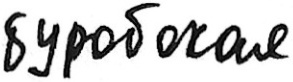буробокая
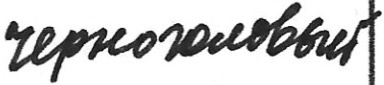черноголовый
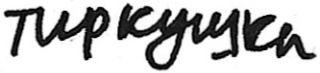тиркушка
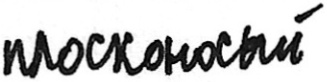плосконосый
